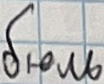бюль
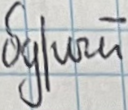бурый
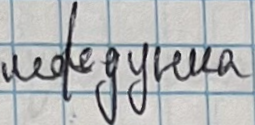мородунка
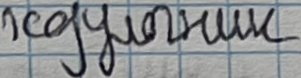ходулочник
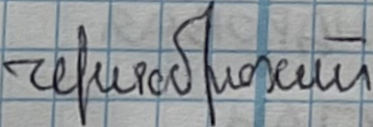чернобрюхий
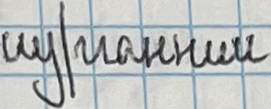курганник
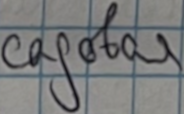садовая
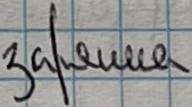зарянка
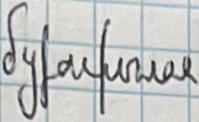бурокрылая
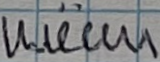клёст
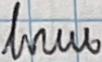выпь
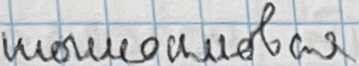тонкоклювая
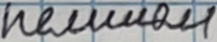пеликан
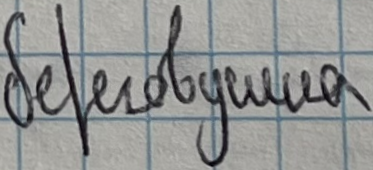береговушка
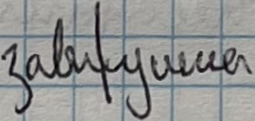завирушка
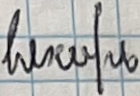вяхирь
